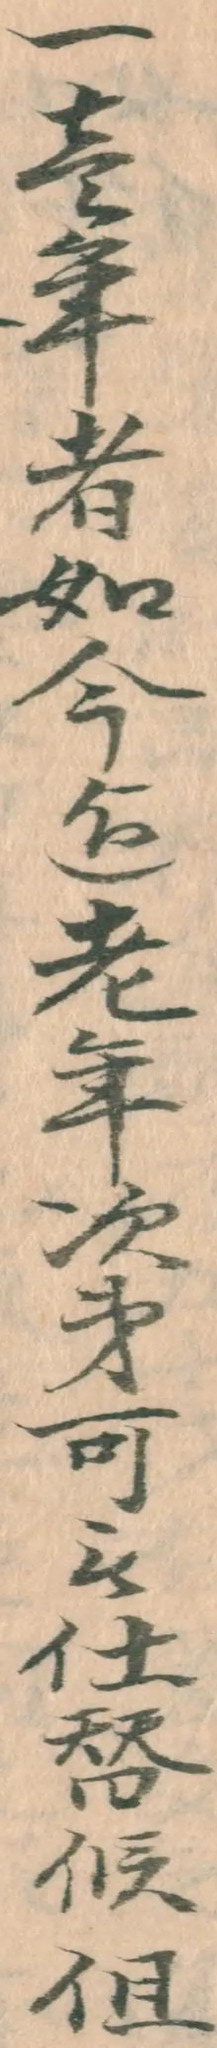一壱年者如今迄老年次第可被仕替候但
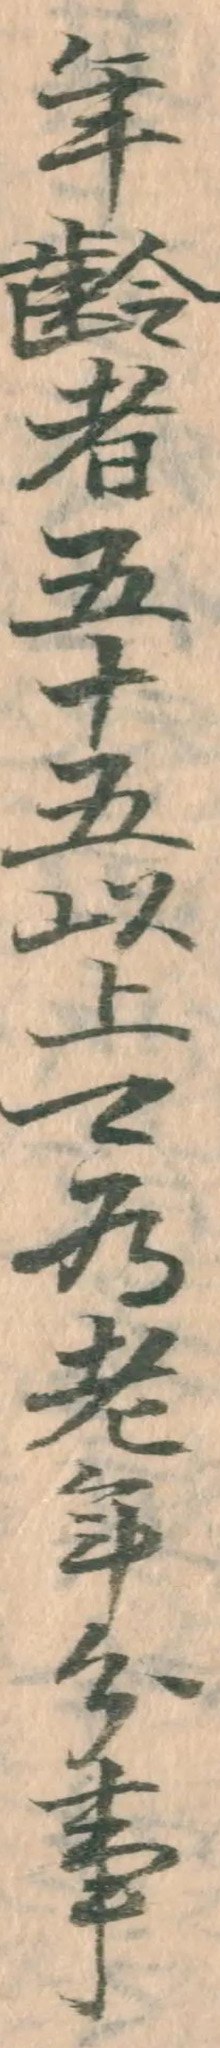年齢者五十五以上可為老年分事
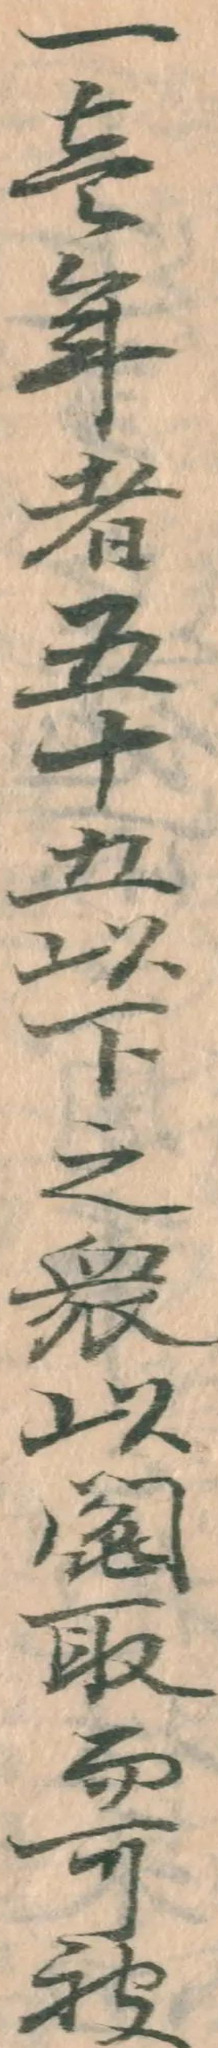一壱年者五十五以下之衆以鬮取而可被
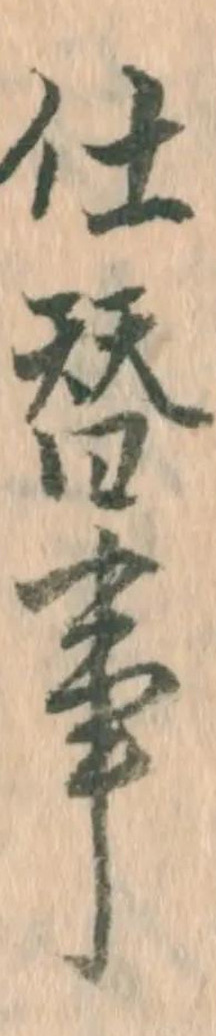仕替事
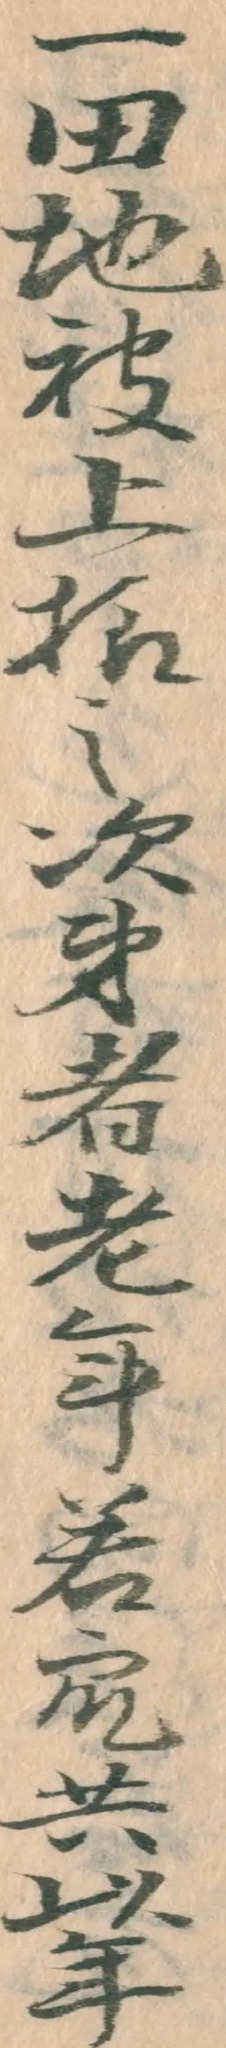一田地被上様之次第者老年若衆共以年
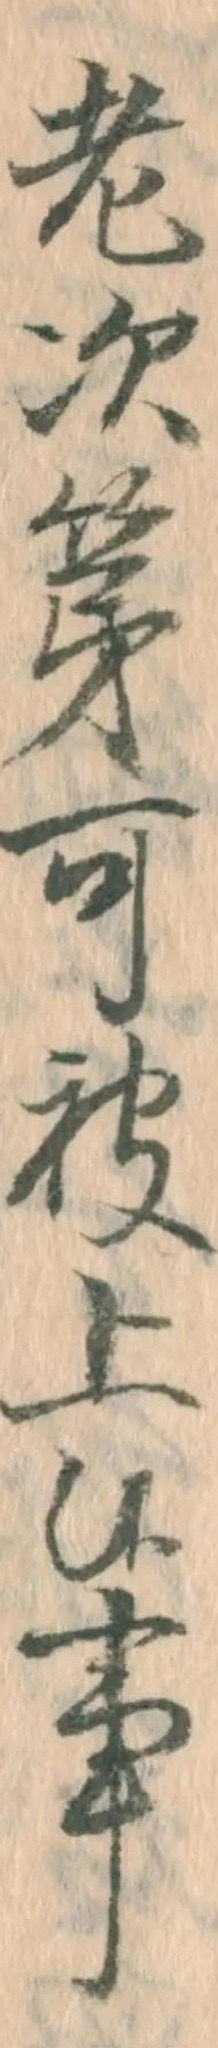老次第可被上候事
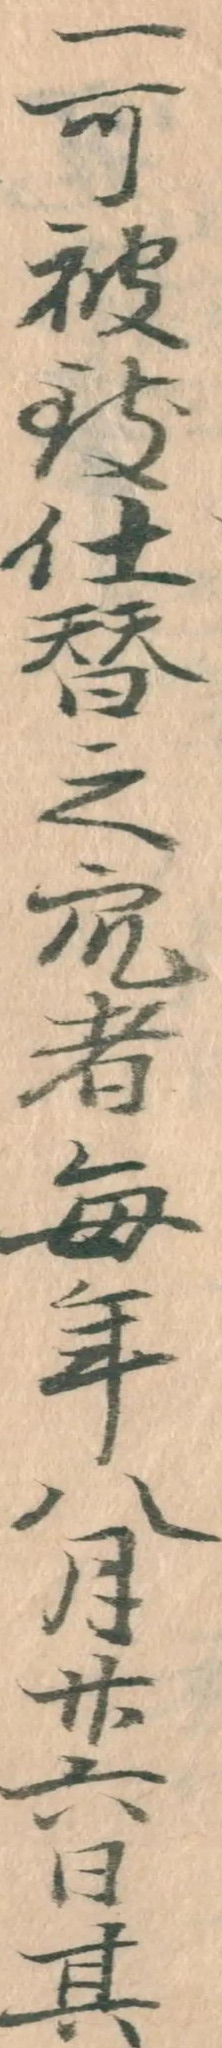一可被致仕替之衆者毎年八月廿六日其
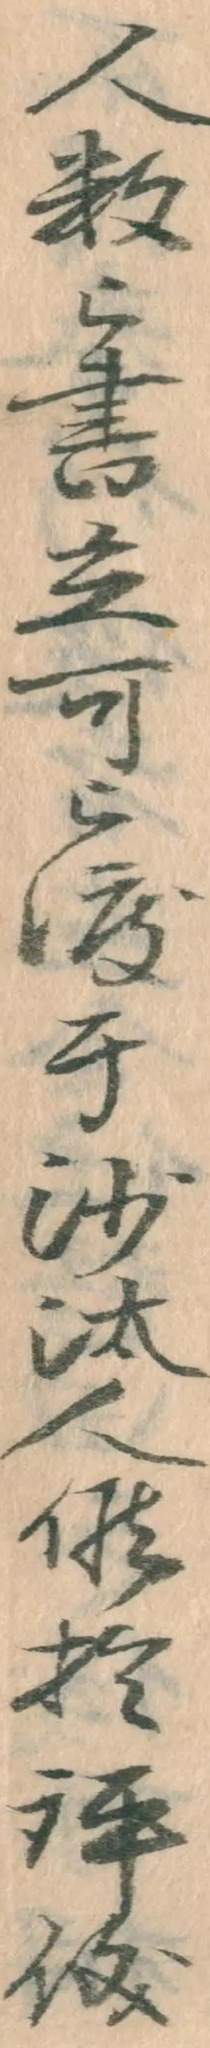人数被書立可被渡于沙汰人俄於評議

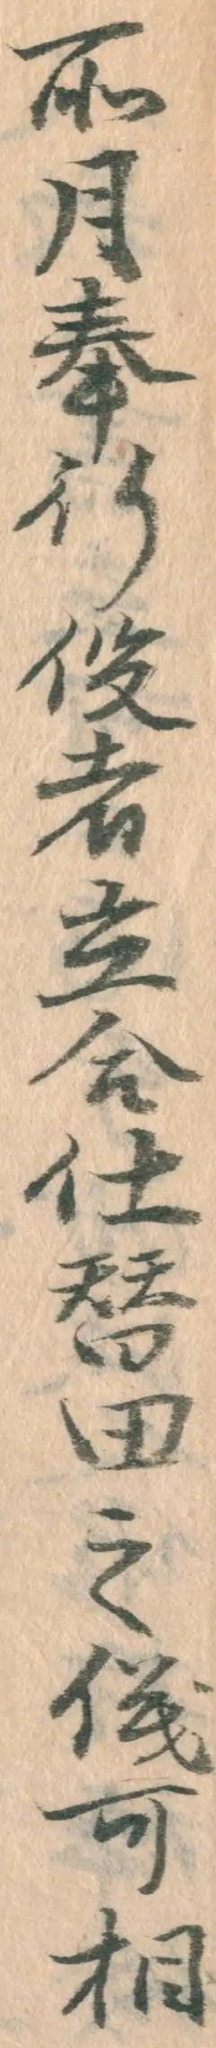所月奉行役者立合仕替田之儀可相
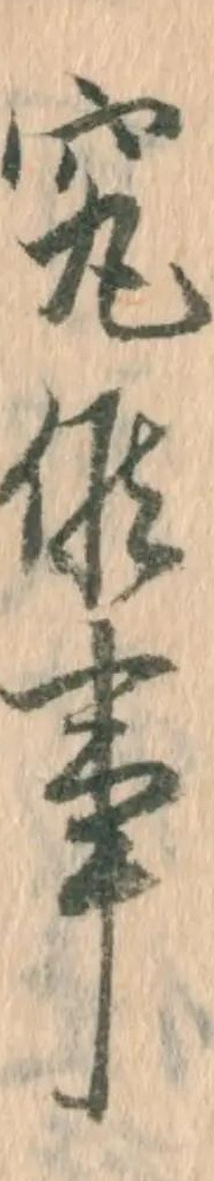究候事
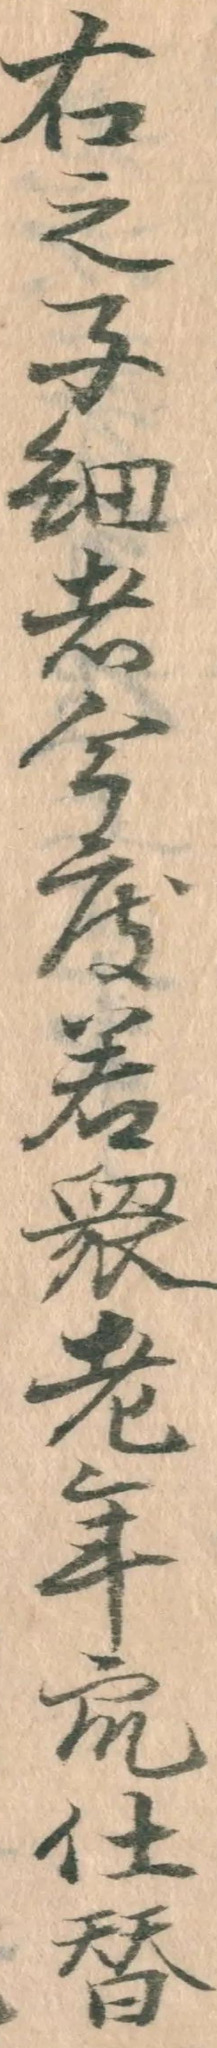右之子細者今度若衆老年衆仕替
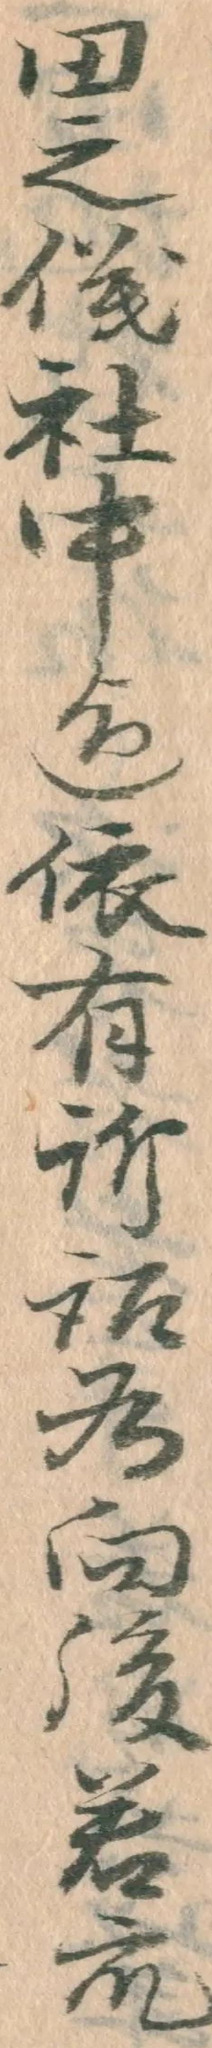田之儀社中迄依有訴詔為向後若衆
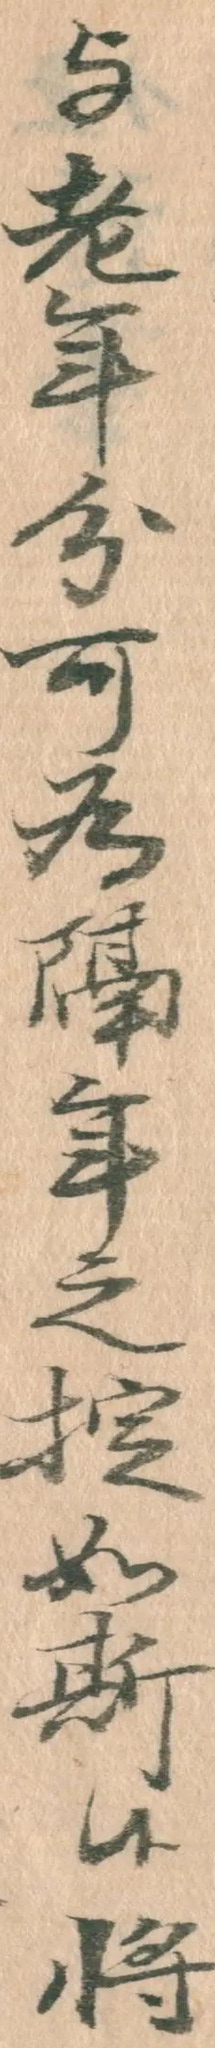と老年分可為隔年之掟如斯候将
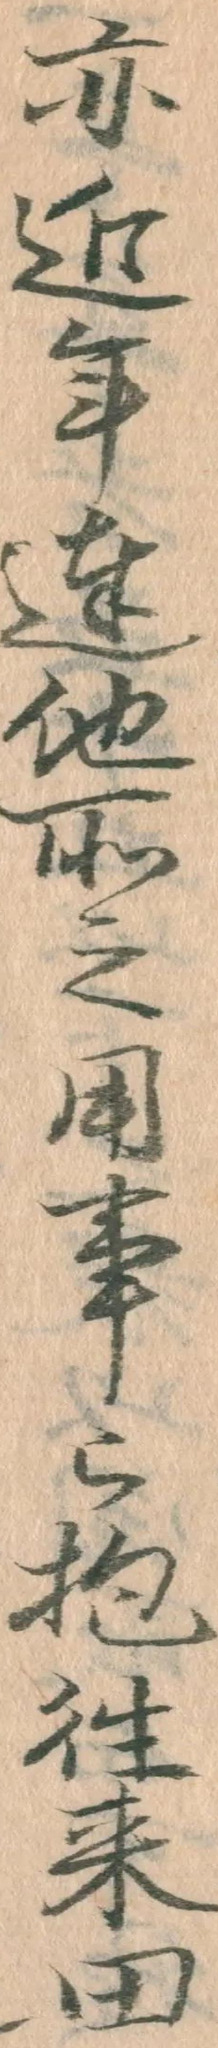亦近年達他所之用事被抱往来田
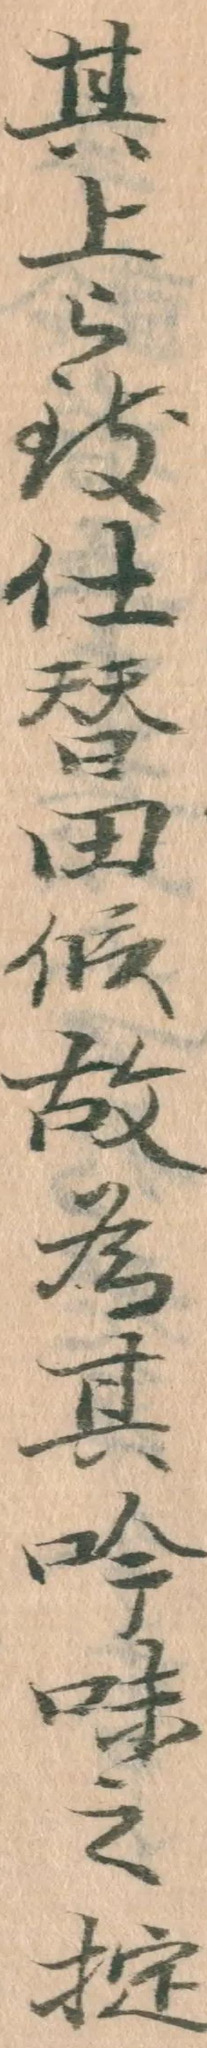其上被致仕替田候故為其吟味之掟
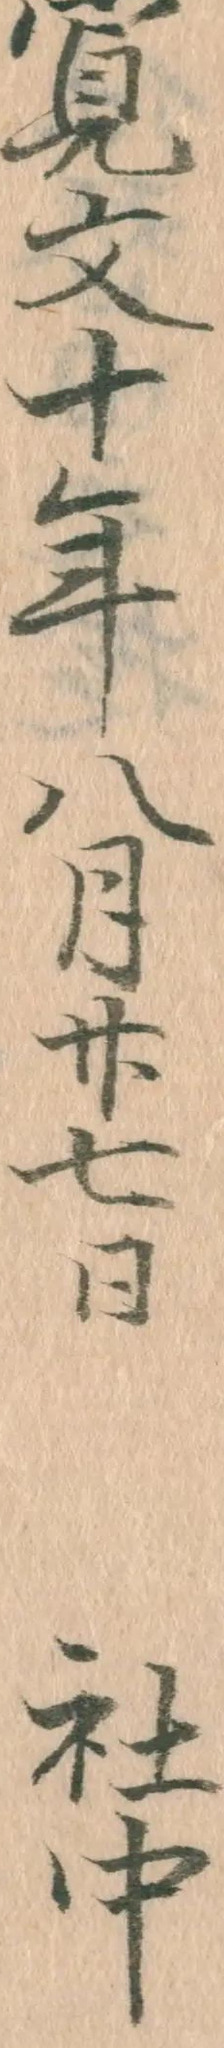寛文十年八月廿七日社中
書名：賀茂社記録. 第39冊
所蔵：国立国会図書館 National Diet Library, JAPAN
